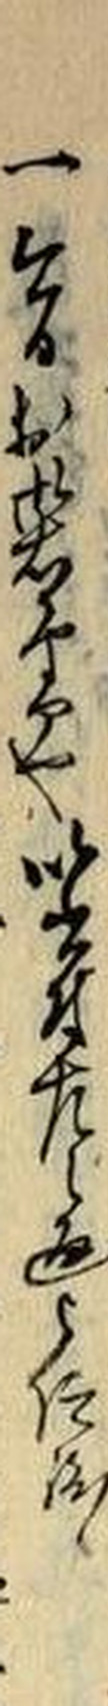一今日於御右筆部や以書付左之通被仰渡候
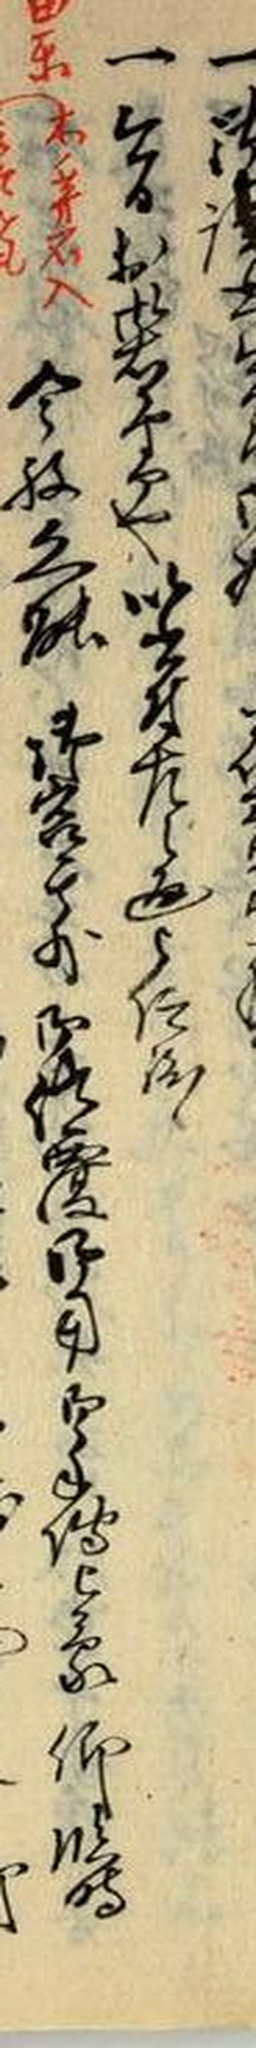今般久能御宮其外御修覆御用御手伝被蒙仰臨時
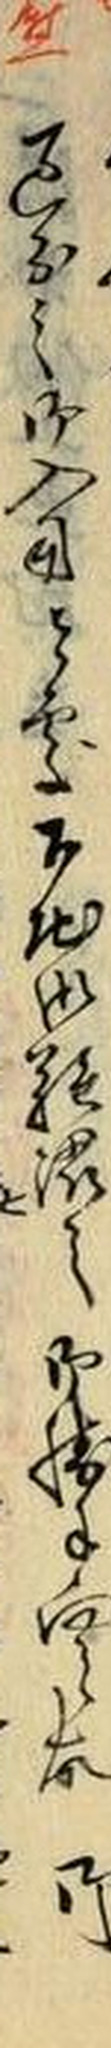過分之御入用ニ候処下地御難渋之御勝手向候故御
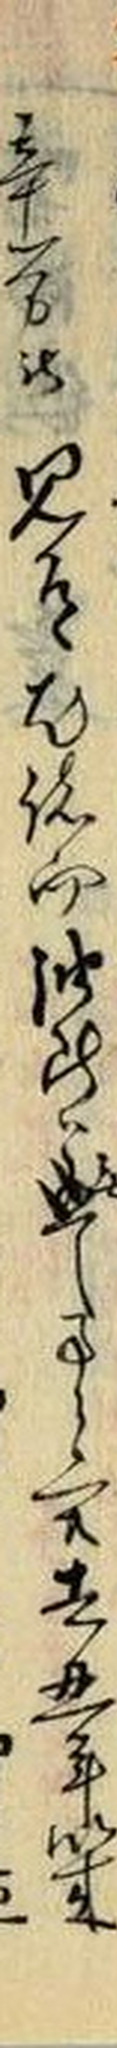辛労被思召候尤諸向油断ハ無之事ニ候へ共去丑年以来
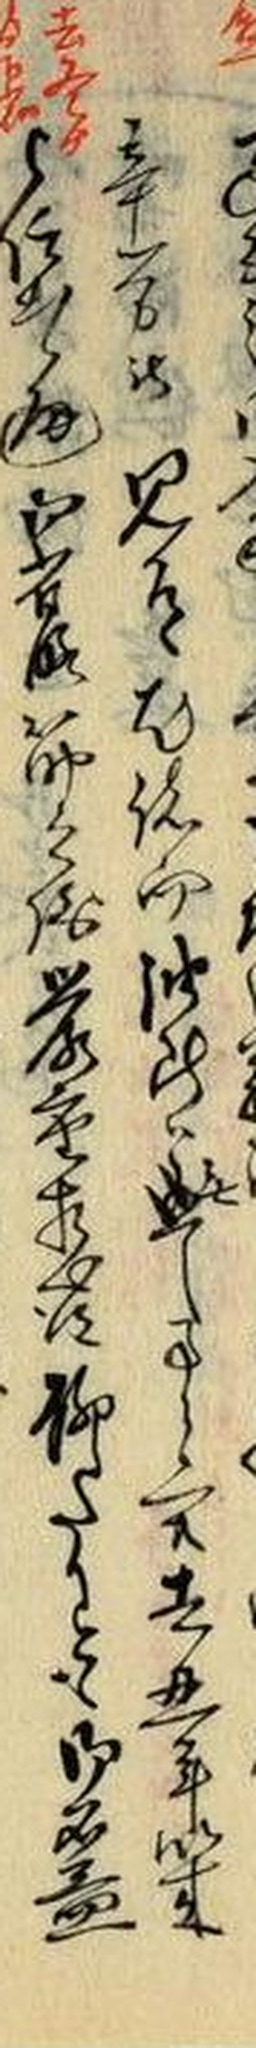被仰出候通御省略筋之儀厳重相心得聊たりとも御不益
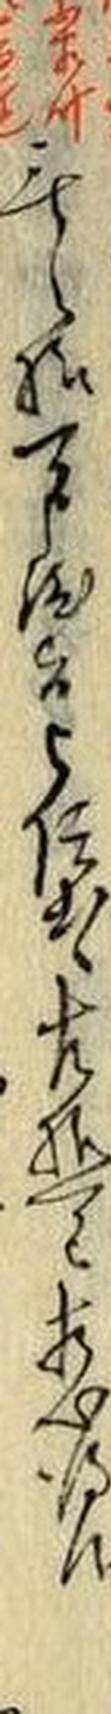無之様可申渡旨被仰出候左様可被相心得候
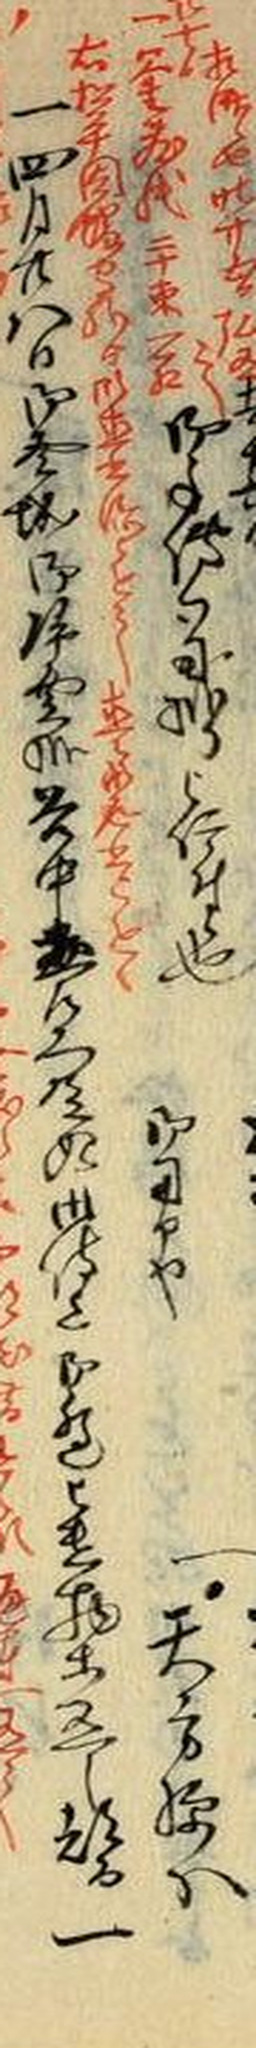一四月廿八日御登城御帰殿掛谷中惣左衛門殿始御侍迄御逢被遣物等有之都而一
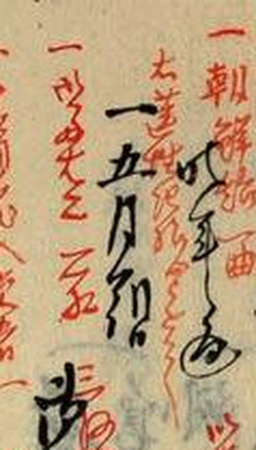一五月朔日
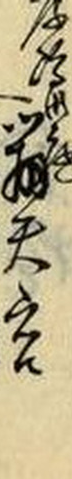弁天宮
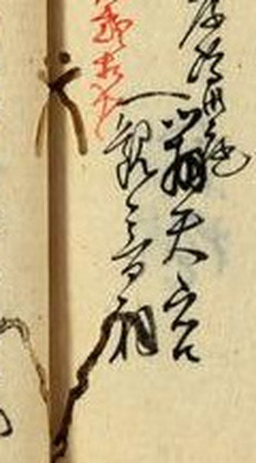観音祠
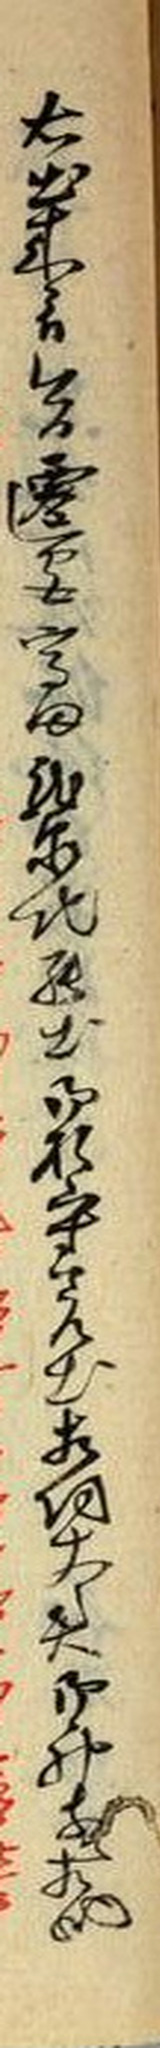右出来候付今日遷宮高田龍泉院罷出御札守差出相伺大奥御神前へ相納
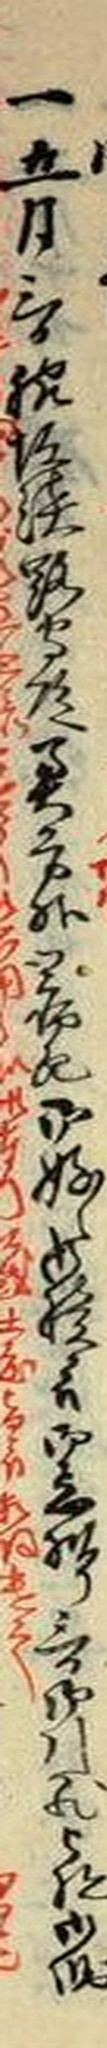一五月三日脇坂淡路守殿奥方様御病死御好之御ニ付御忌掛り三日御引籠被遊御側
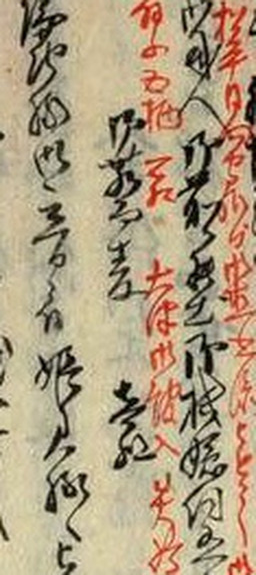御蕎麦壱組
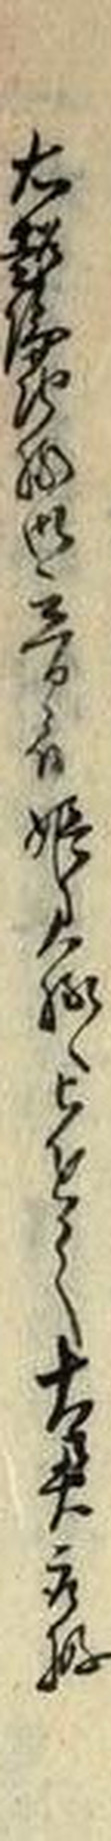右超倫院様御立日ニ付姫君様へ被進之大奥取扱
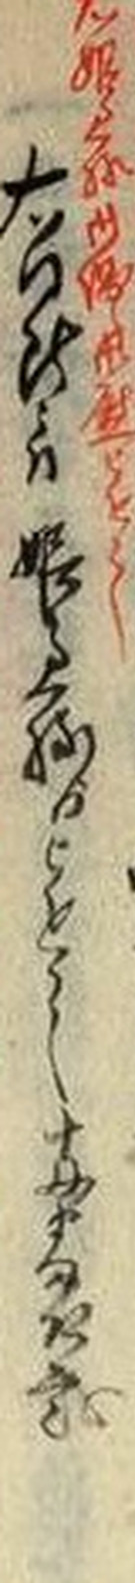右同断ニ付姫君様ゟ被進之両番頂戴
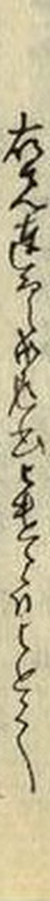右先達而之御返書被遣候ニ付被進之
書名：少傅日録抄（斉承付側向頭取日記、在府）
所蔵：福井県文書館 Fukui Prefectural Archives
